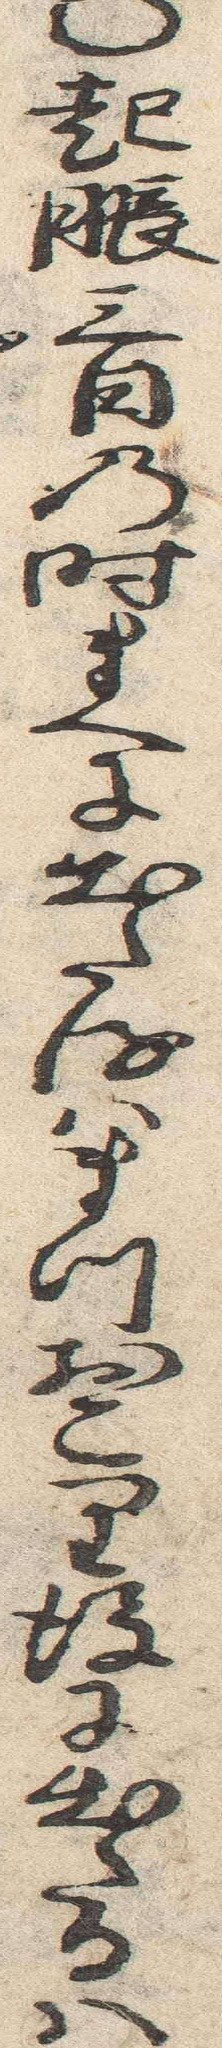○起脹三日の時まへに出たるはまつおこり後に出たるは
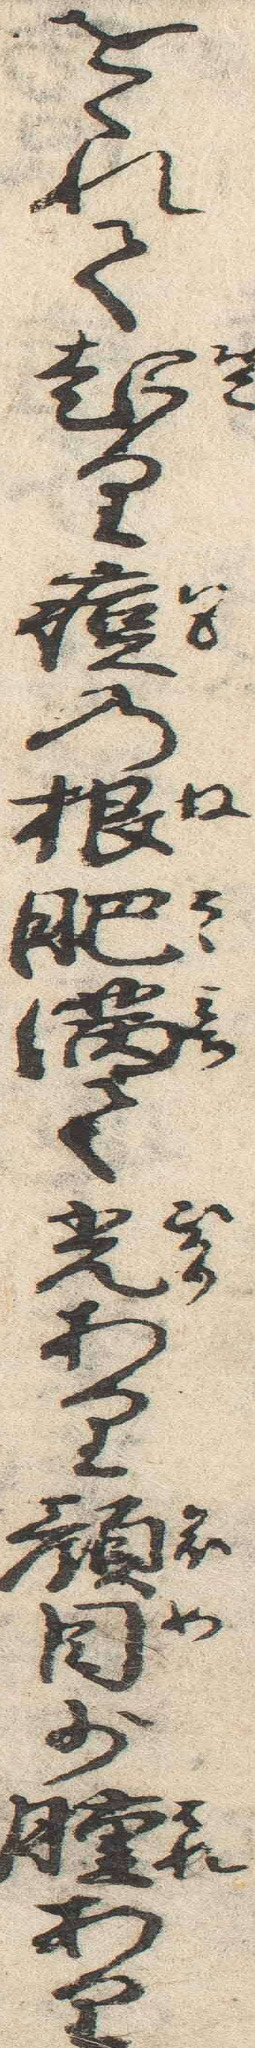をくれて起り痘の根肥満て光あり顔目少腫あり
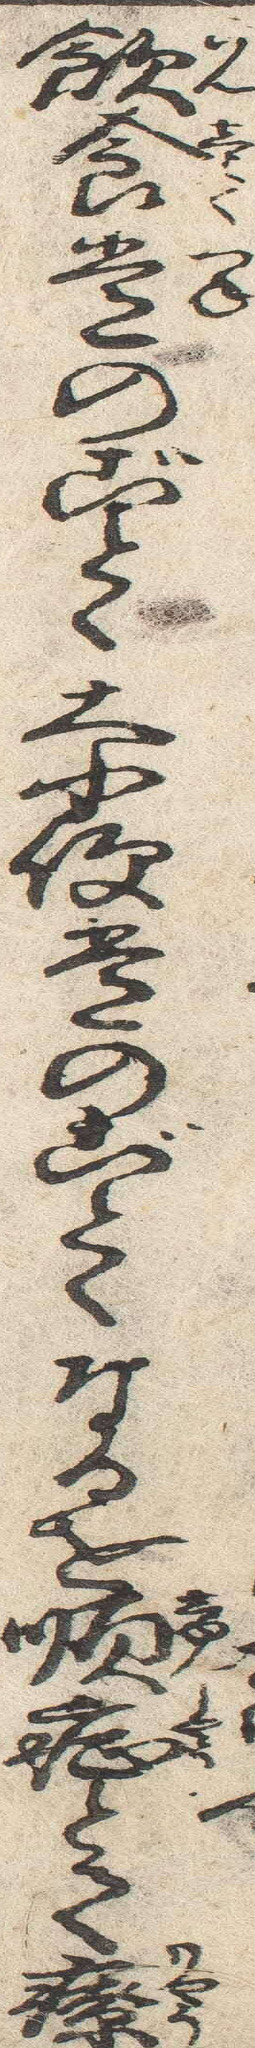飲食常のごとく大小便常のごとくなるを順症とて療
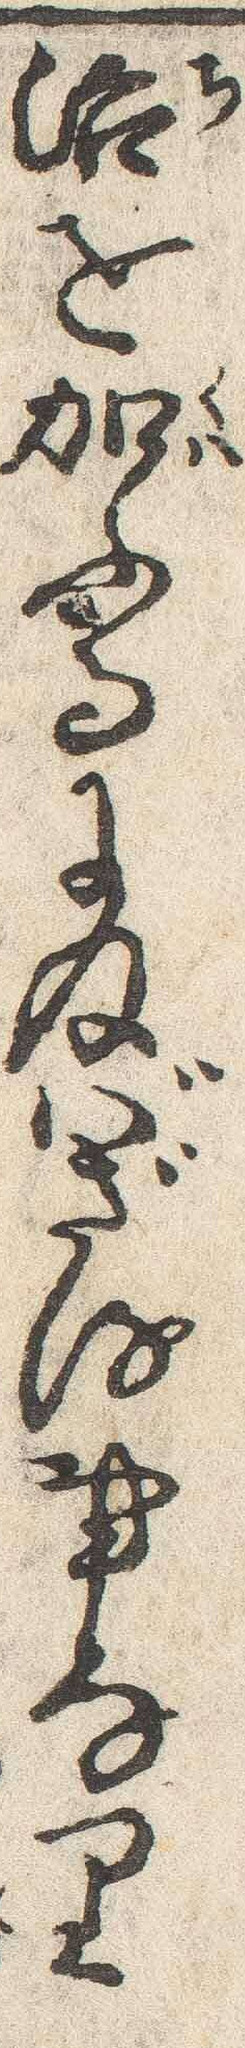治を加ふるに及ばざる事なり
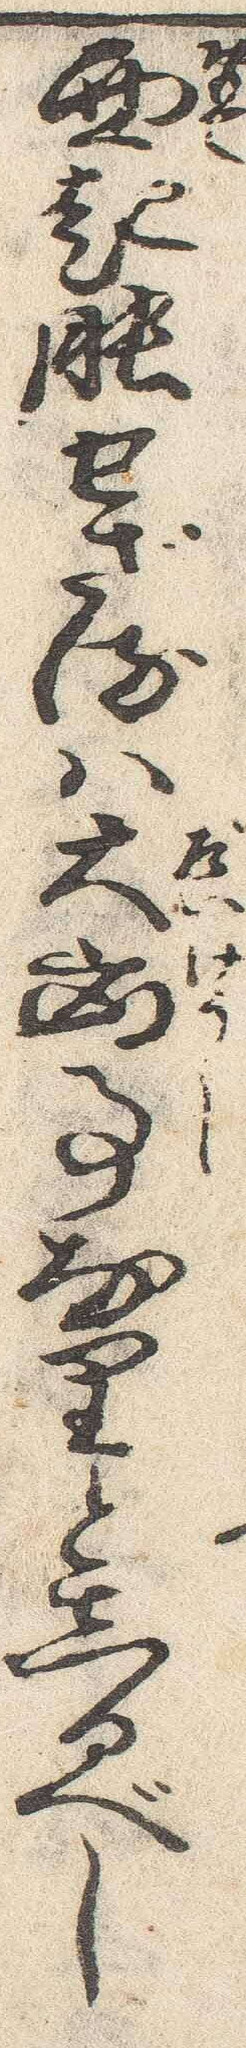面起脹せざるは大凶事なりとしるべし
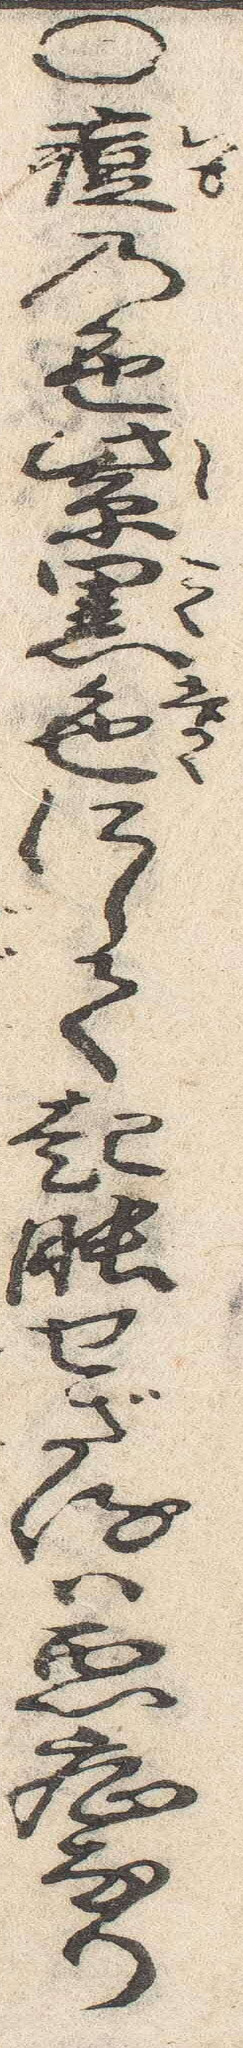○痘の色紫黒色にして起脹せざるは悪症なり
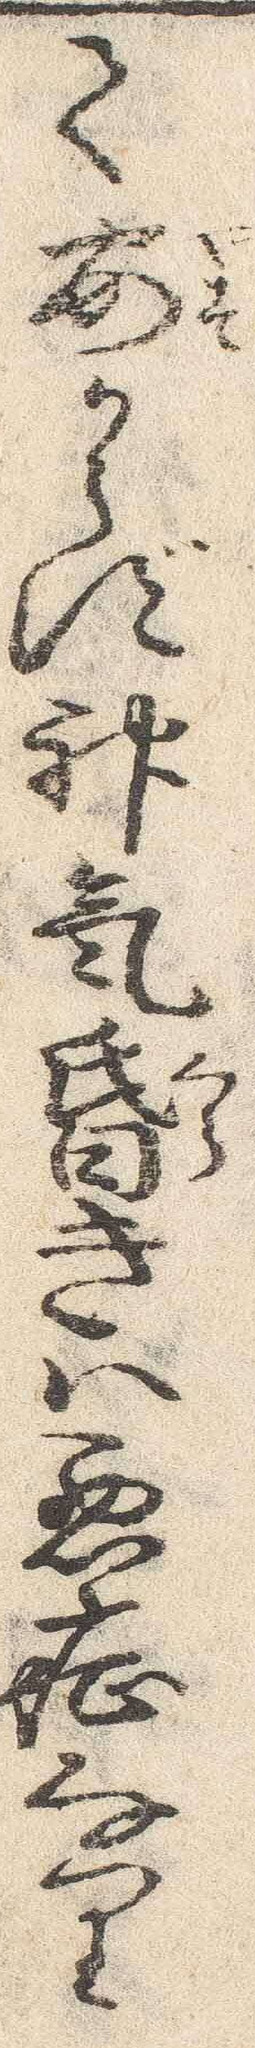て安からず神気昏きは悪症なり
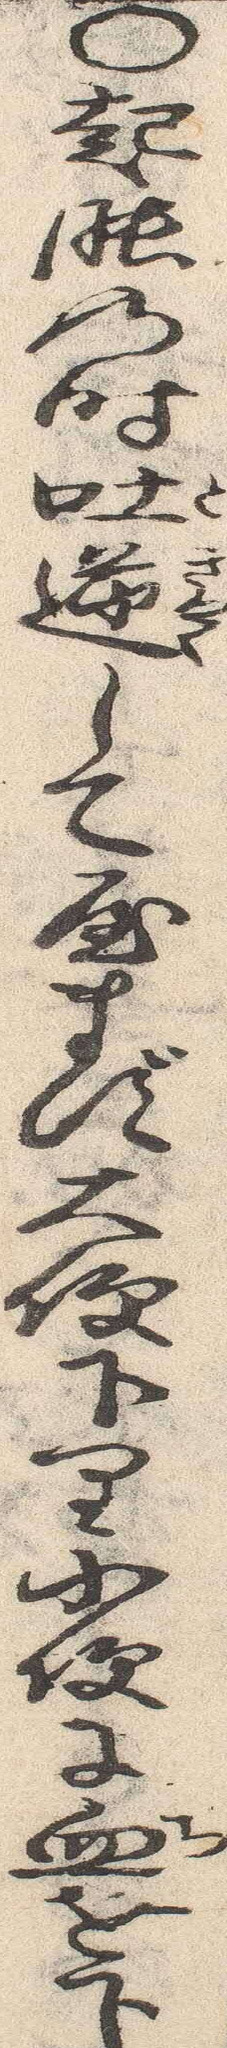○起脹の時吐逆してやまず大便下り小便に血を下
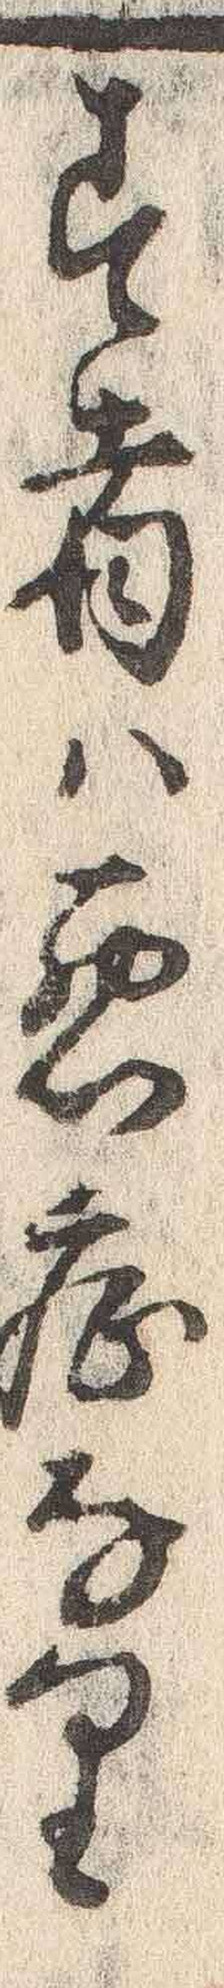す者は悪症なり
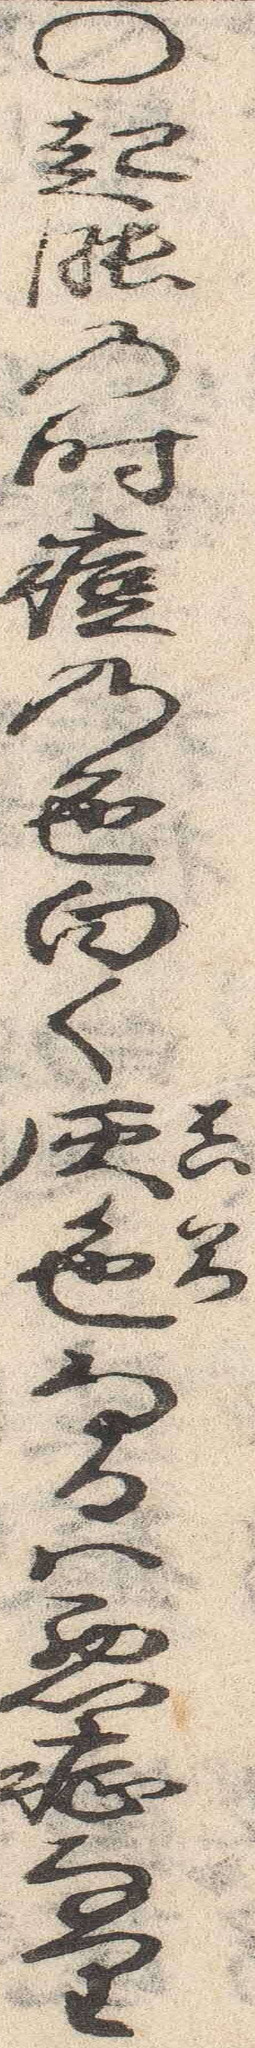○起脹の時痘の色白く灰色なるは悪症なり
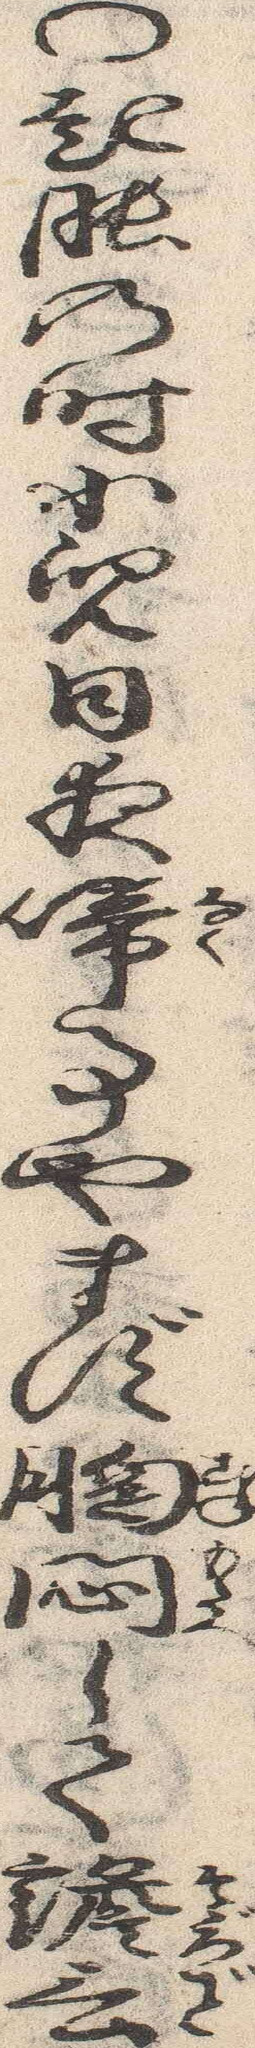○起脹の時小児日夜啼事やまず胸悶して譫言
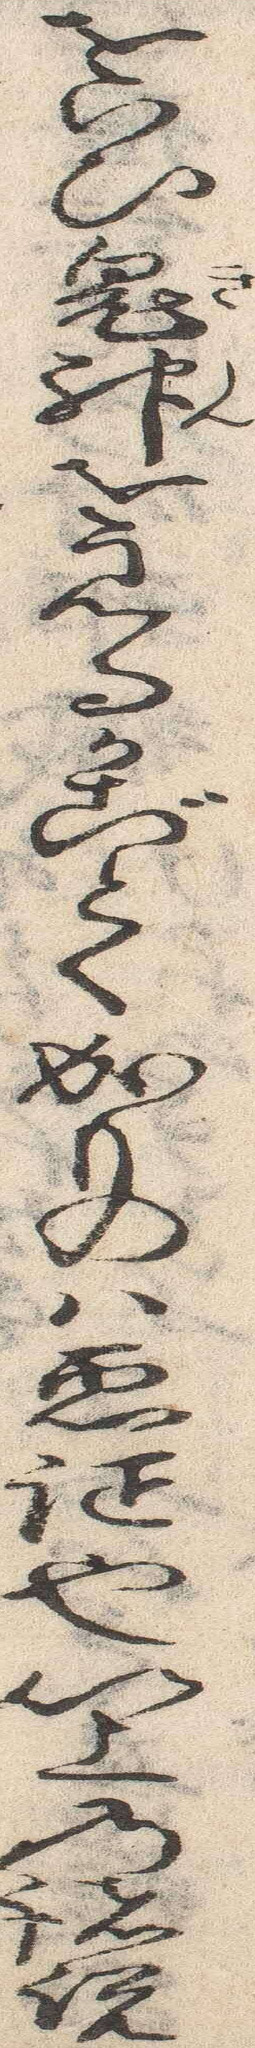をいひ鬼神を見るかごとく成ものは悪証也以上の諸説
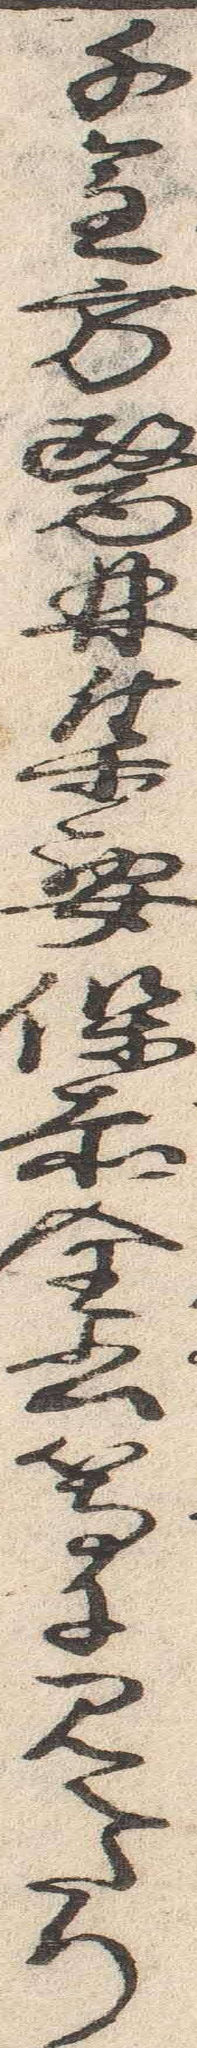千金方医林集要保赤全書等に見えたり
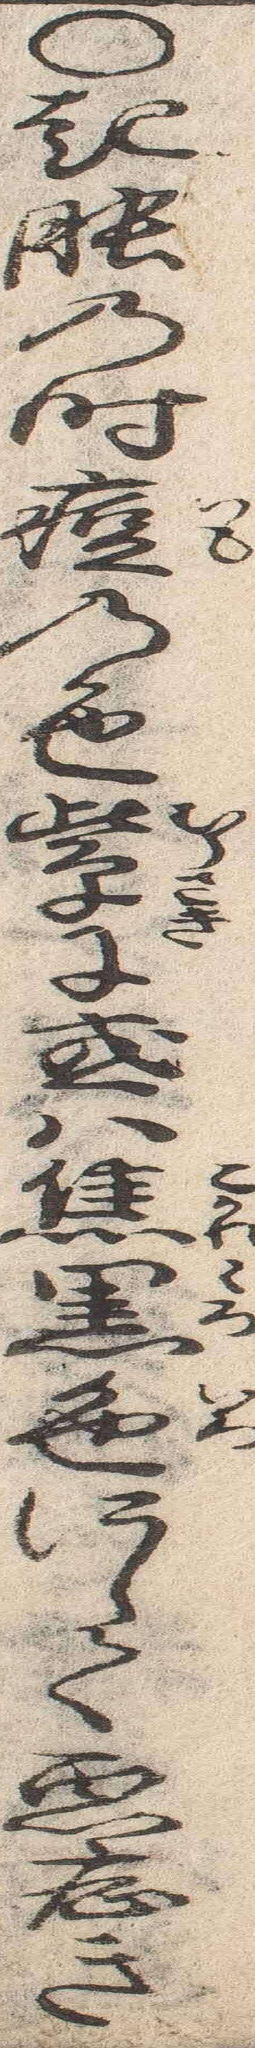○起脹の時痘の色紫に或は焦黒色にして悪症き
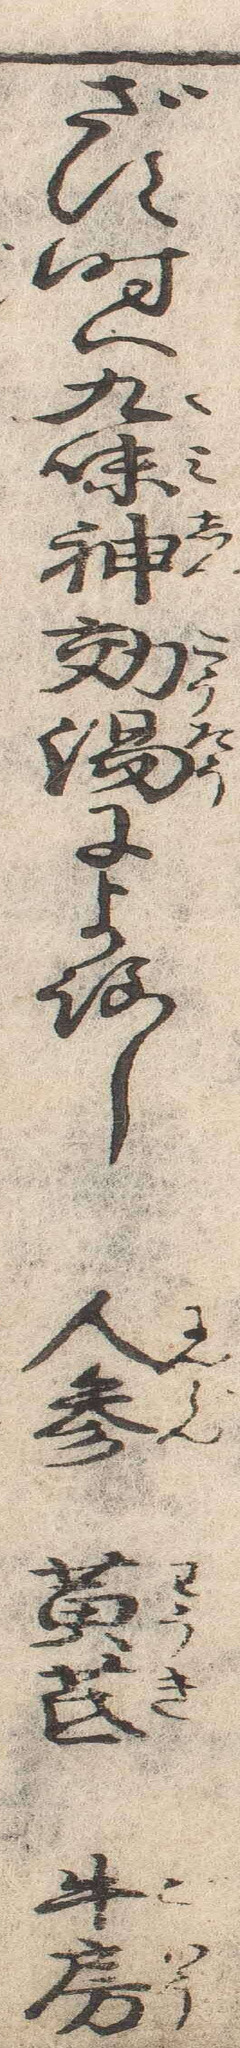ざす時は九味神効湯によろし人参黄茋牛房
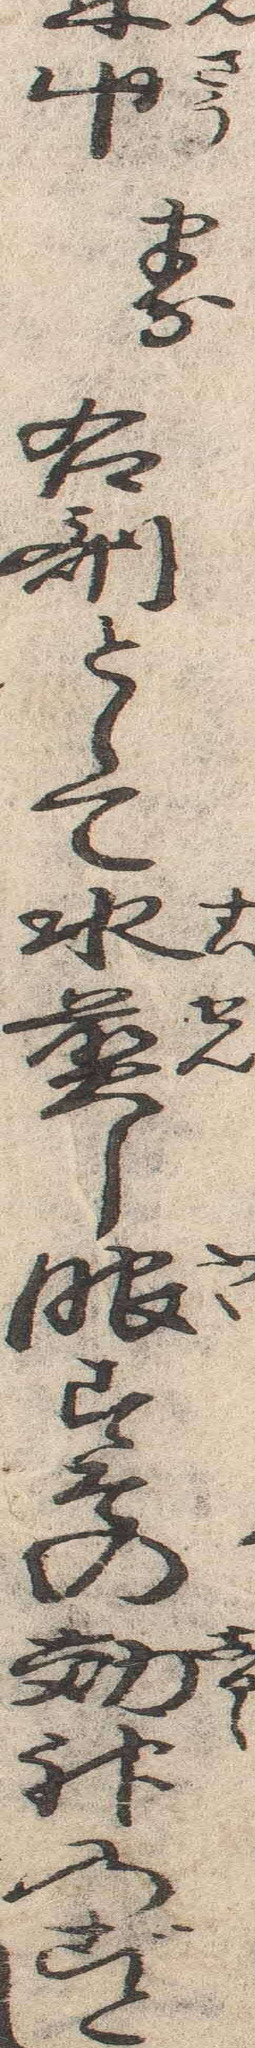甘草半分右剤として水煎し服すその効神のごとし
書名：小児必用養育草
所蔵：東京学芸大学附属図書館 国文学研究資料館
